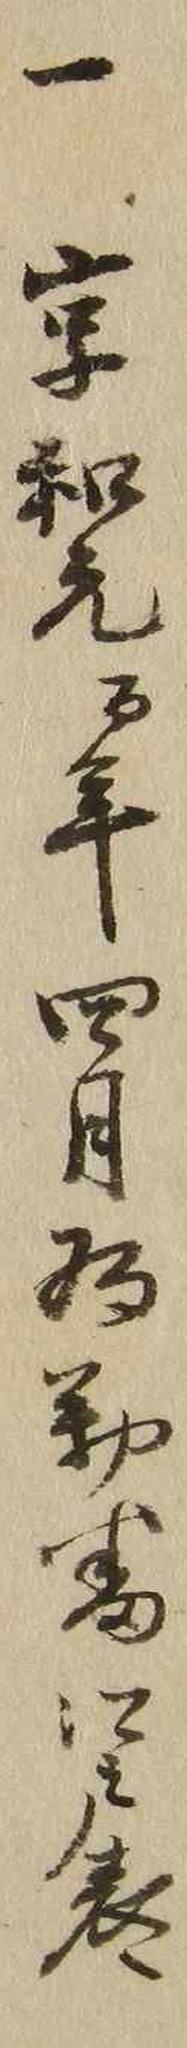一享和元酉年四月為勤番江戸表へ
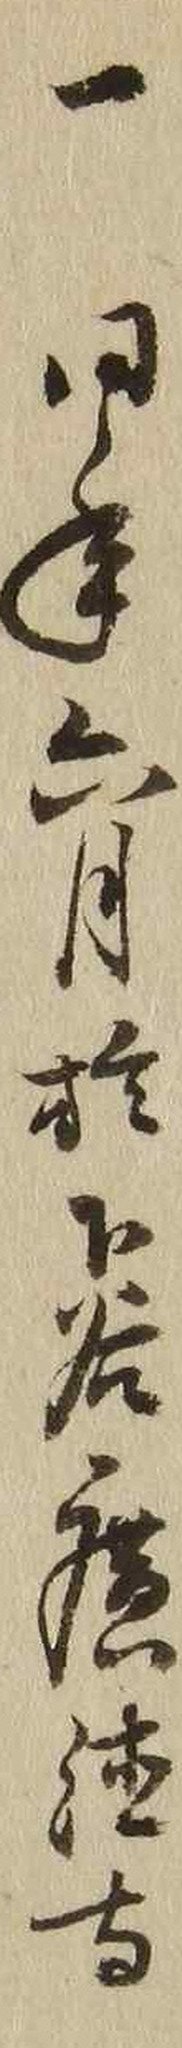一同年六月於下谷広徳寺
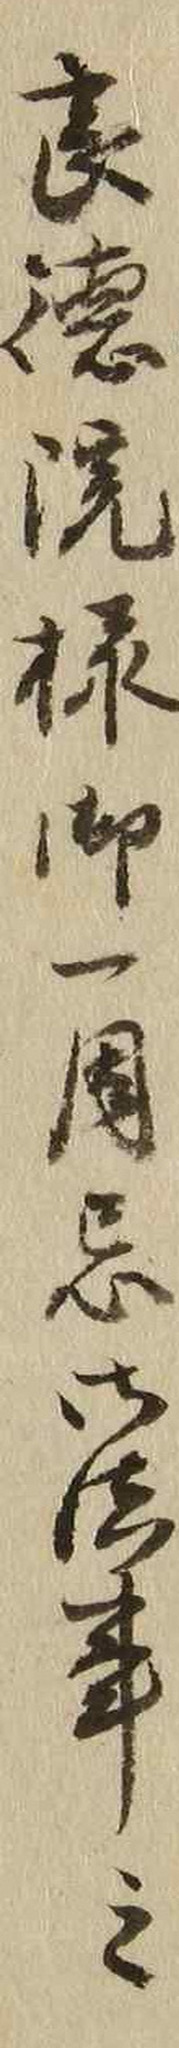良徳院様御一周忌御法事之
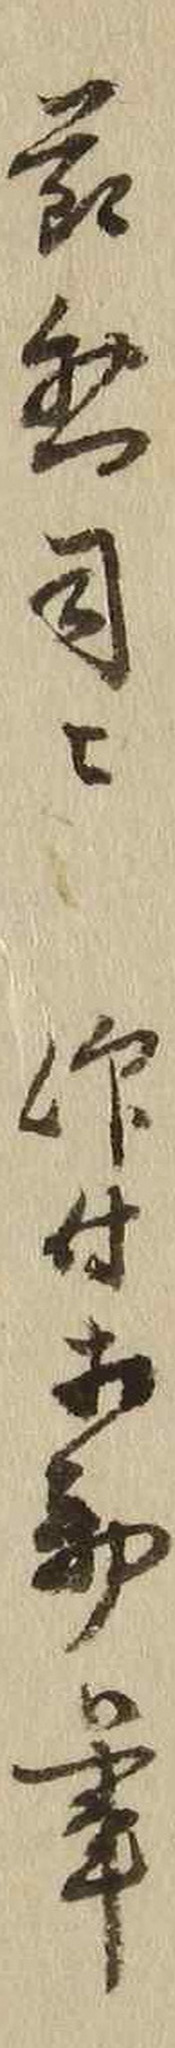節惣司被仰付相勤候事
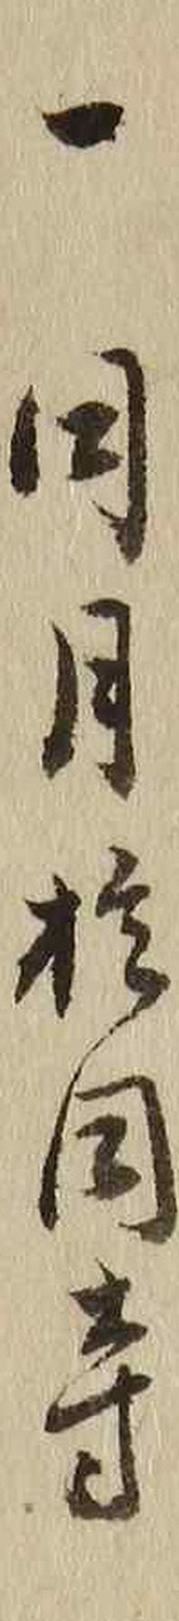一同月於同寺
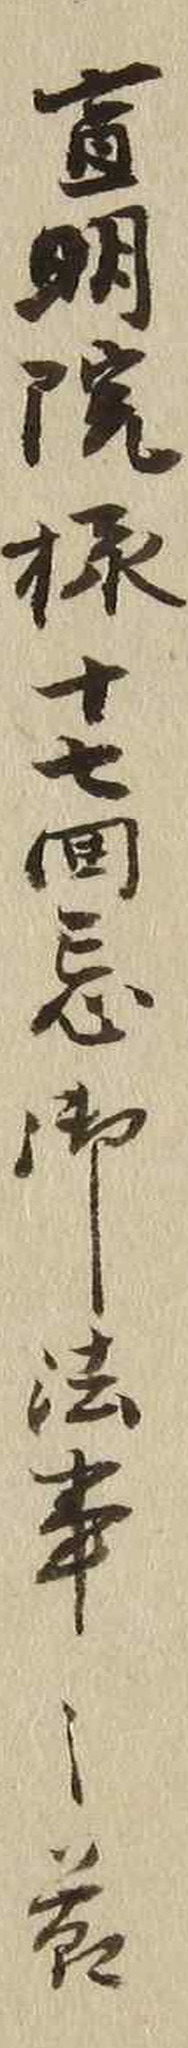宣明院様十七回忌御法事之節
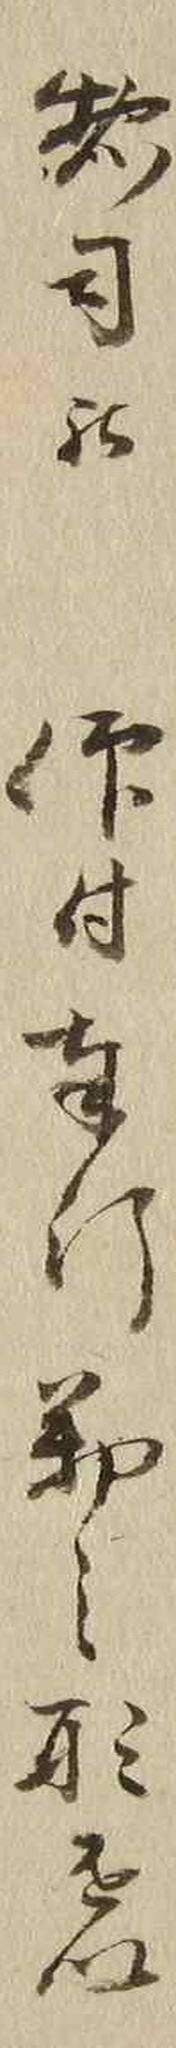惣司被仰付奉行勤之形を以
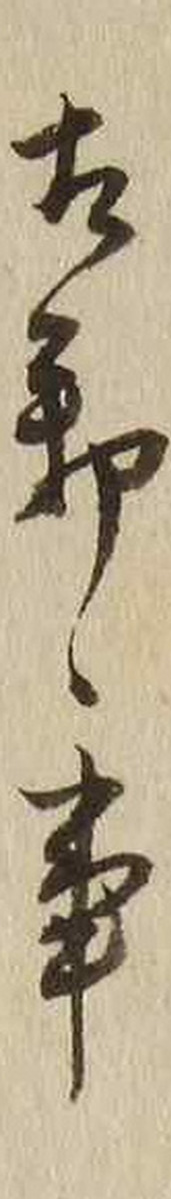相勤候事
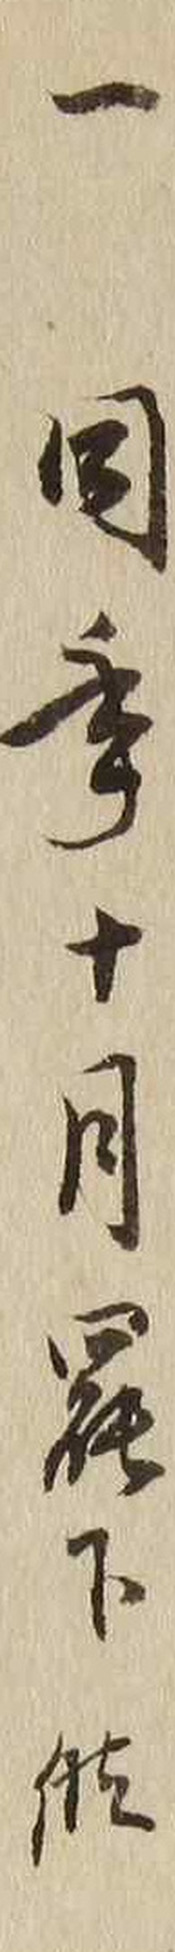一同年十月罷下候
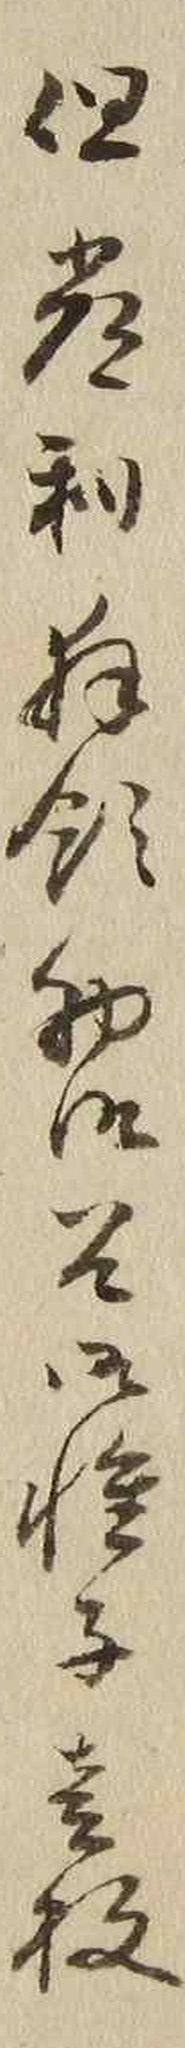但常和拝領物御召御帷子壱枚
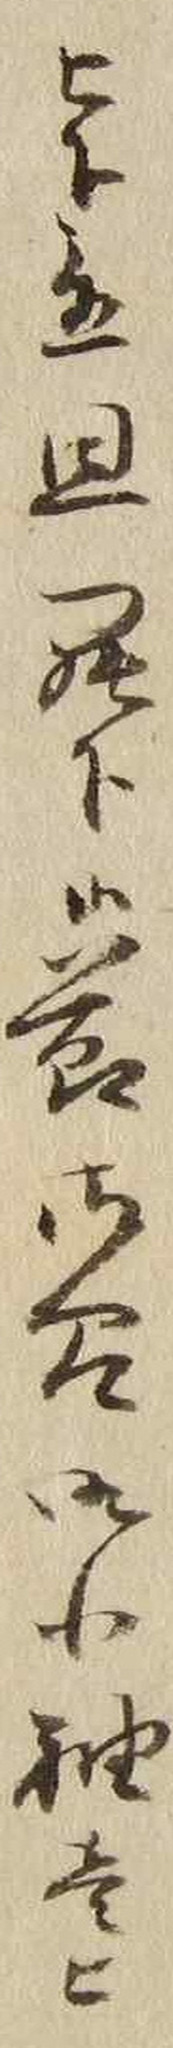被下置且罷下候節御召御小袖壱被
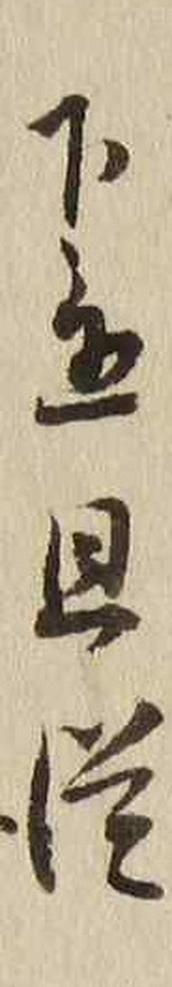下置且従
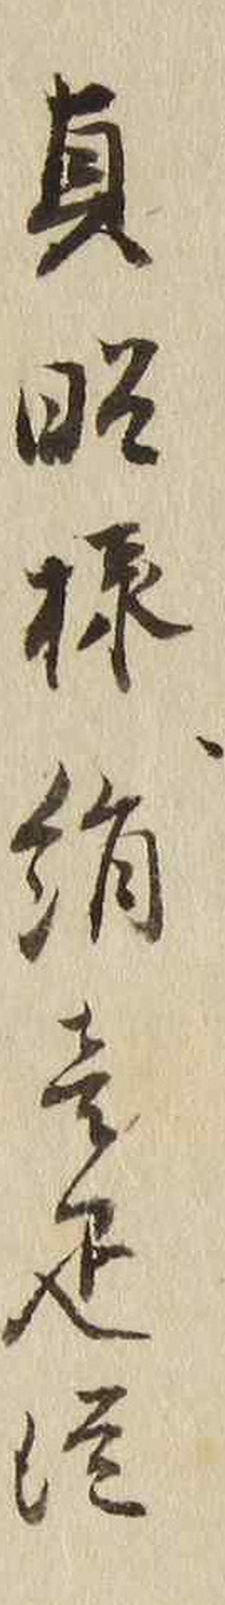貞昭様絹壱疋従
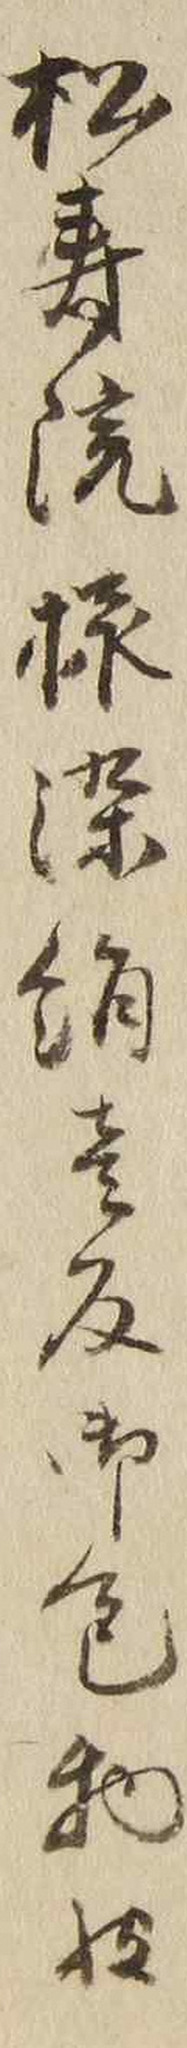松寿院様染絹壱反御包物被
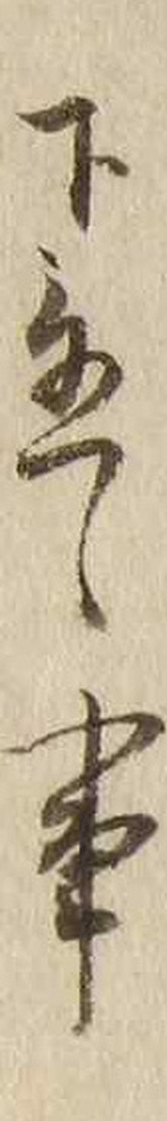下置候事

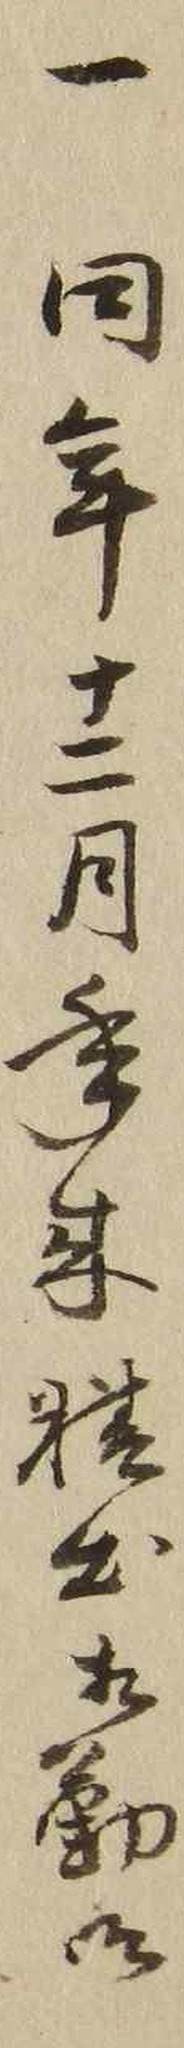一同年十二月年来精出相勤御
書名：諸士系譜　巻之225　ま之部6
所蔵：会津若松市立会津図書館
